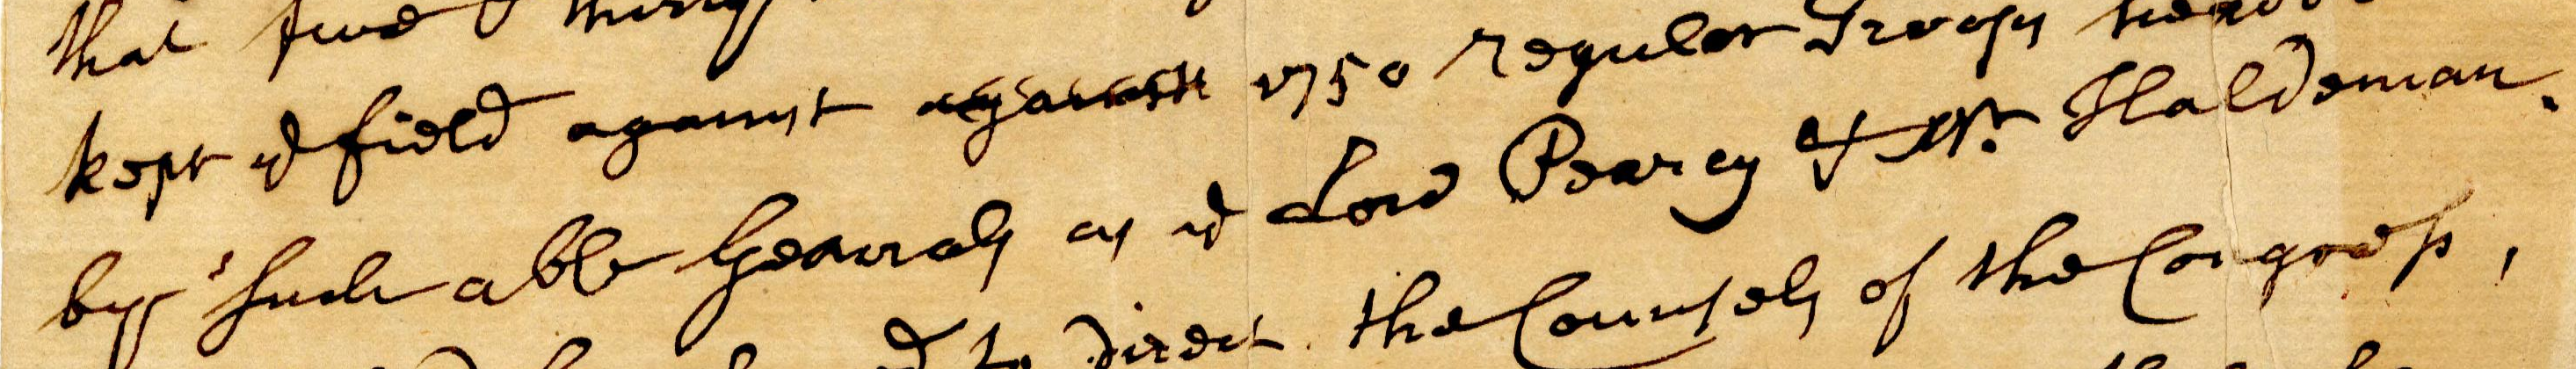by such able Generals as y^e Lord Pearcy & M^r. Haldeman
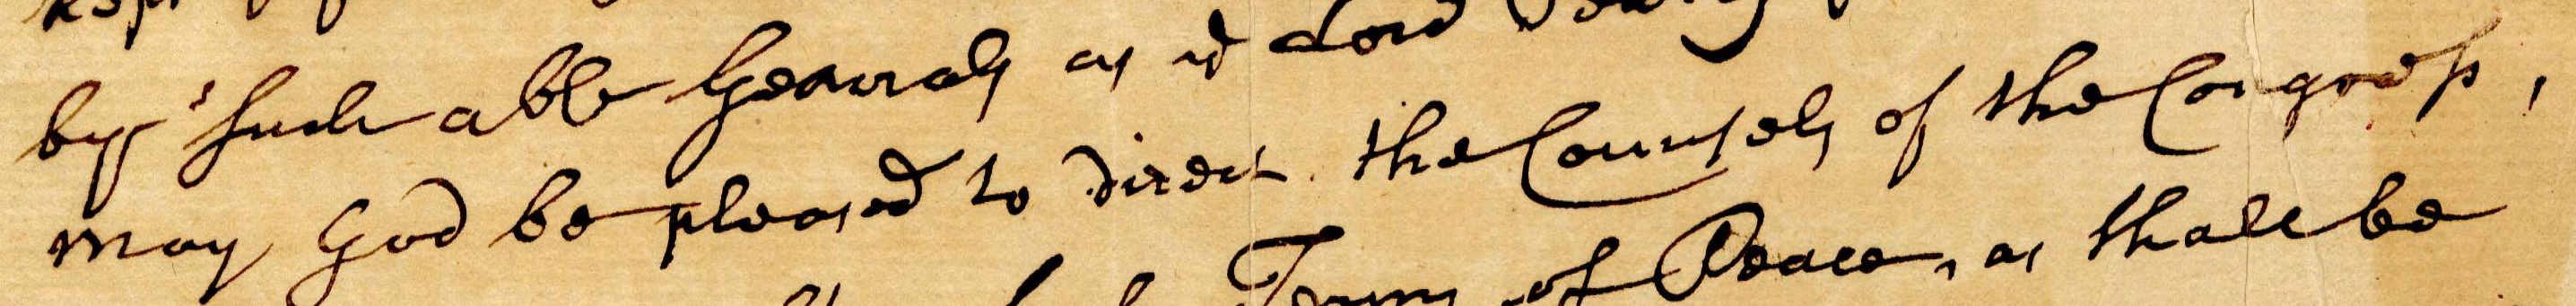may God be pleased to direct the Court of the Congress,
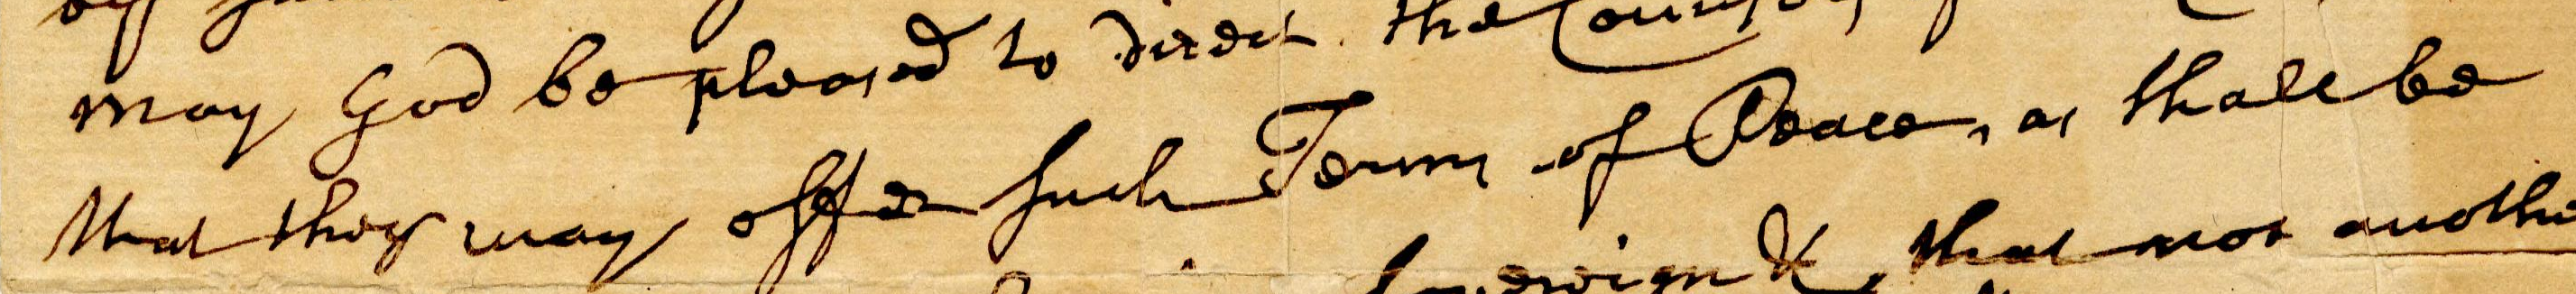that they may offer such Terms of Peace, as shall be
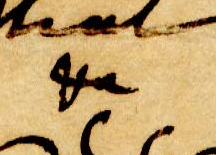&c
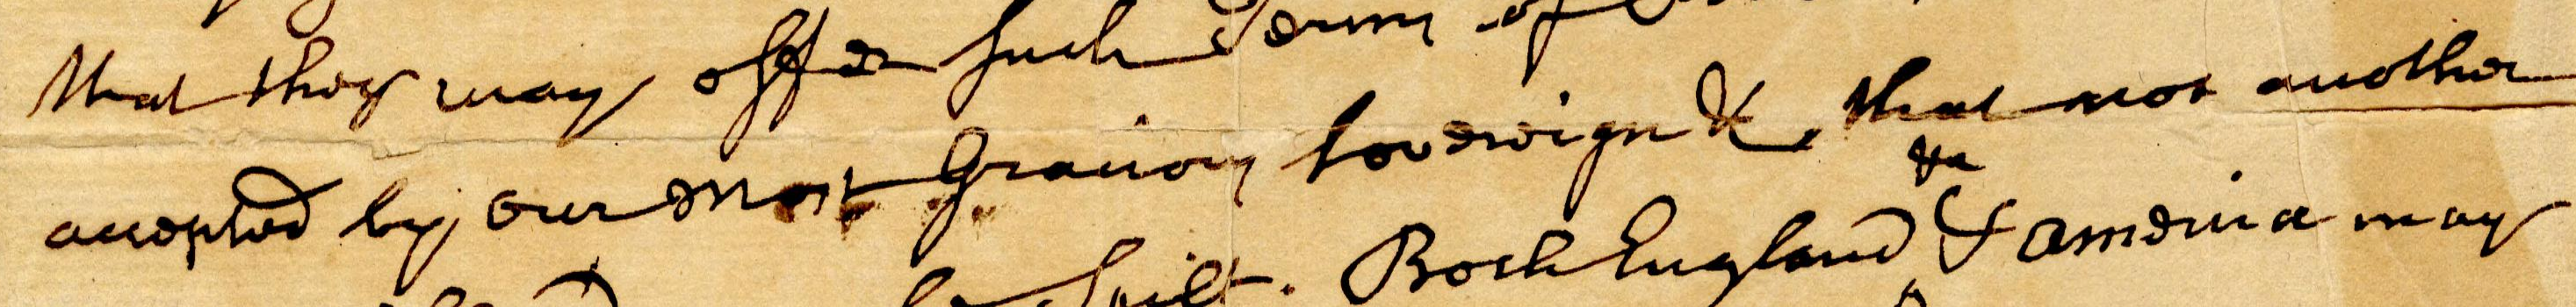accepted by our most gracious Sovereign & that not another
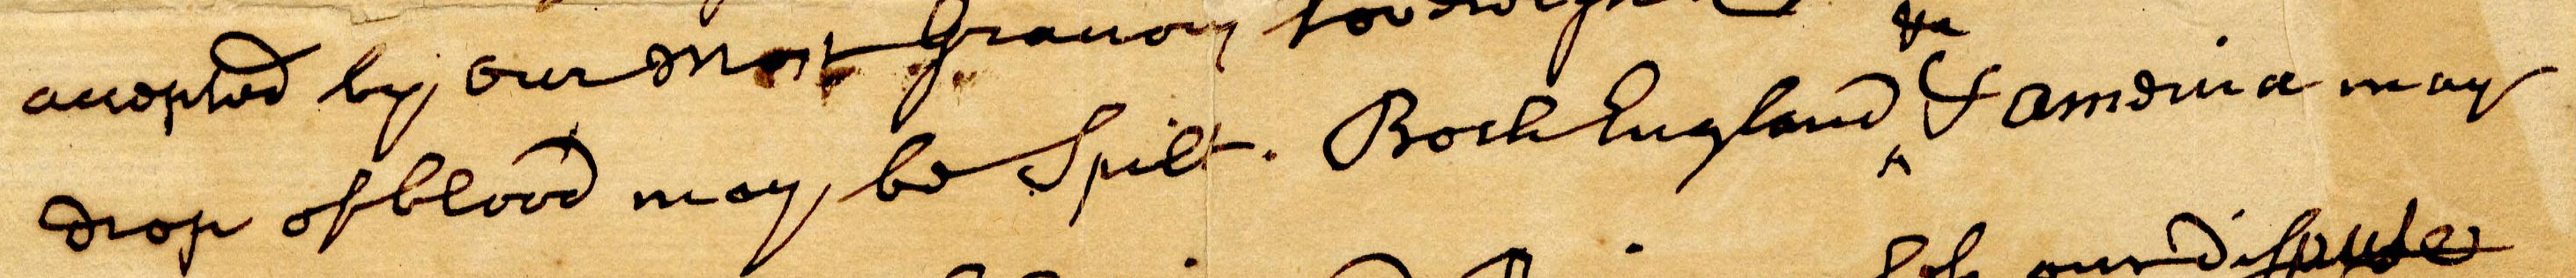drop of blood may be spilt. Both England ^ & America may
